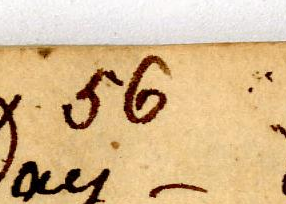56
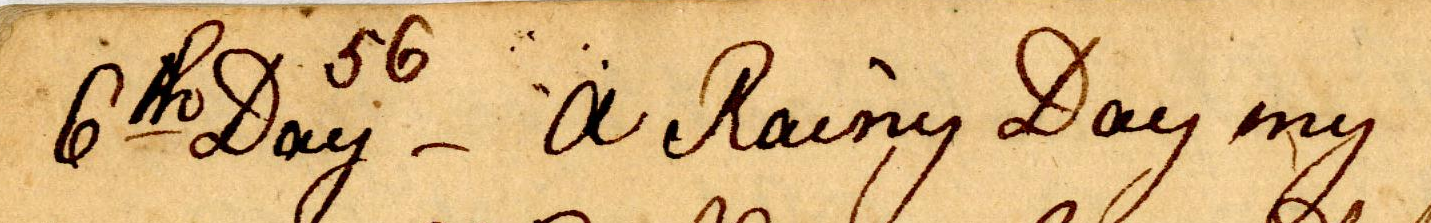6^th Day- a Rainy Day my
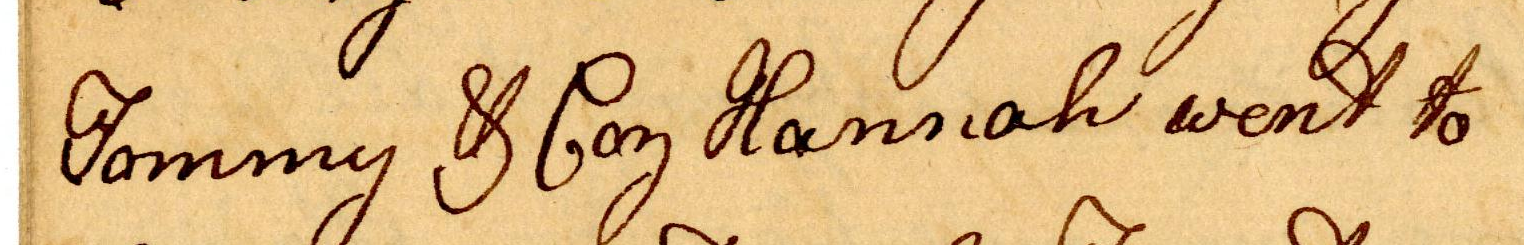Tommy & Coz Hannah went to
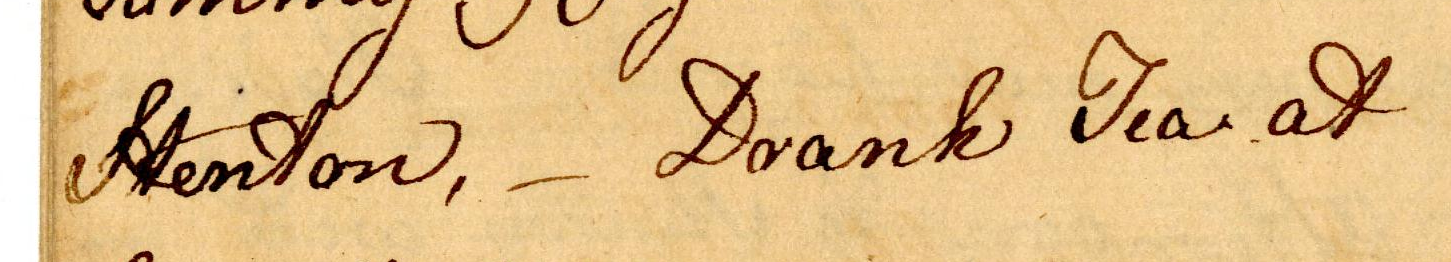Stenton,- Drank Tea at
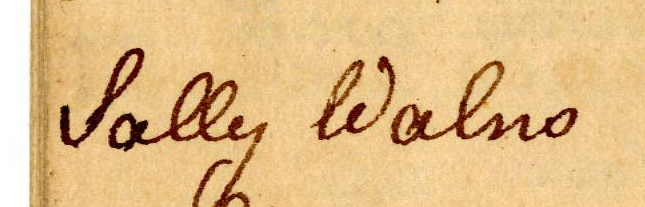Sally Walns
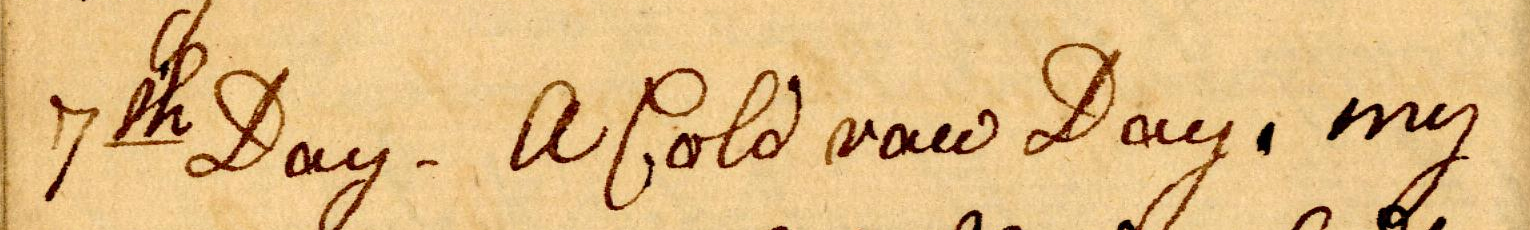7^th Day- A Cold raw Day, my
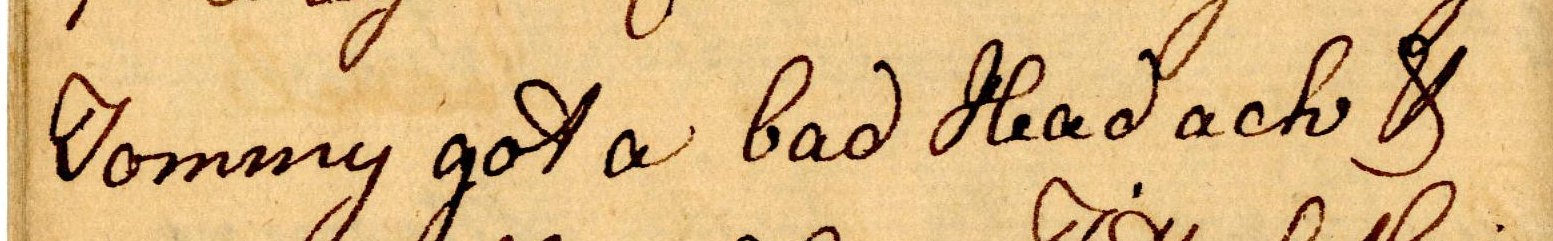Tommy got a bad Head ach &
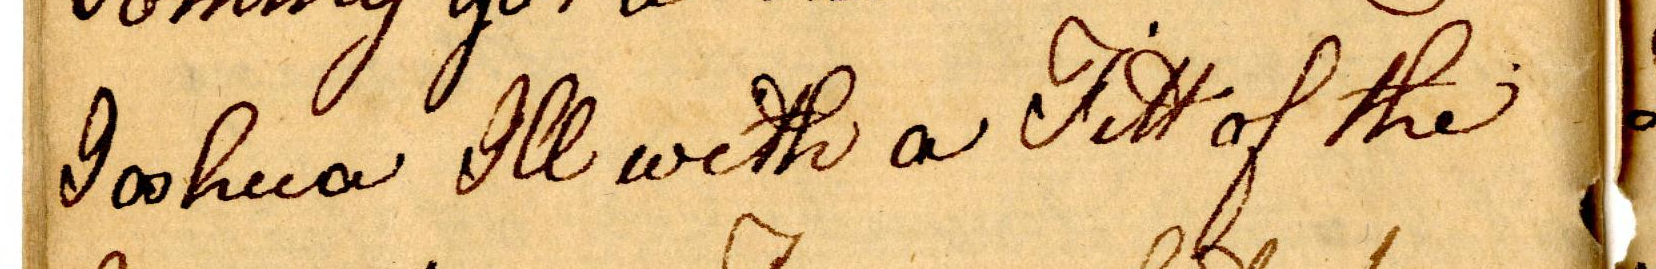Joshua Ill with a Fitt of the
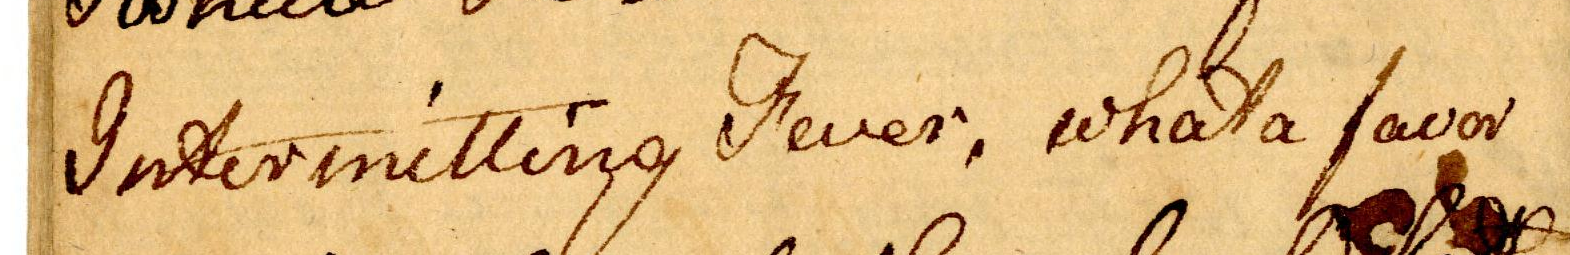Intermitting Fever, what a favor
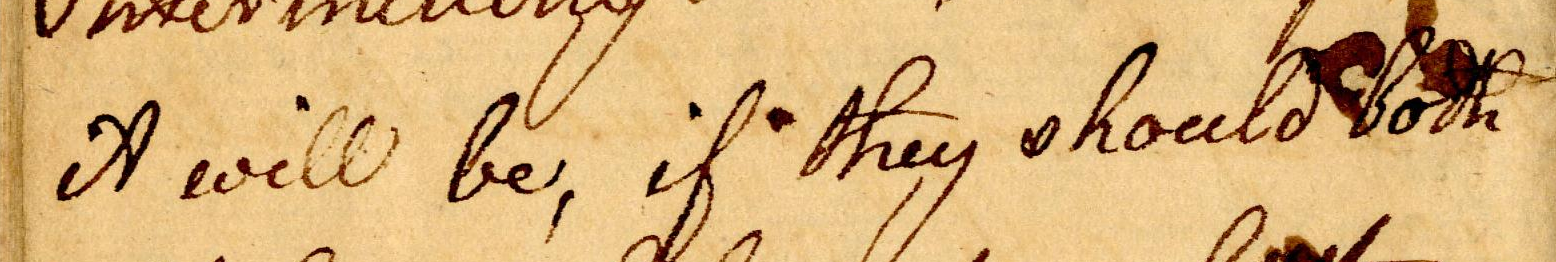it will be, if they should both
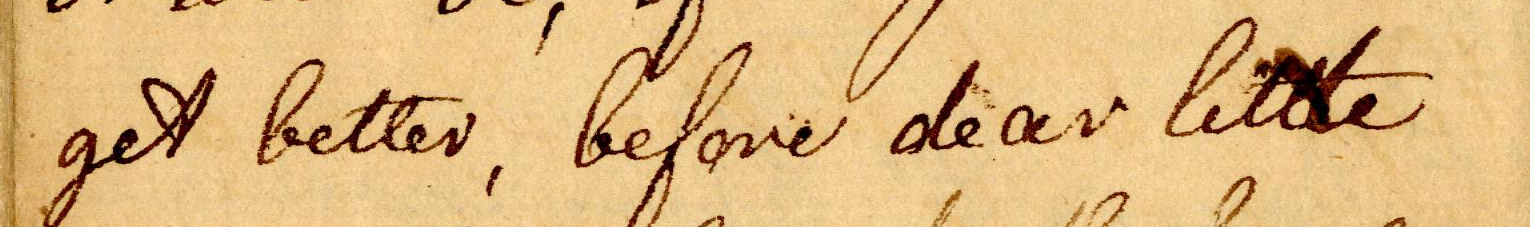get better, before dear little
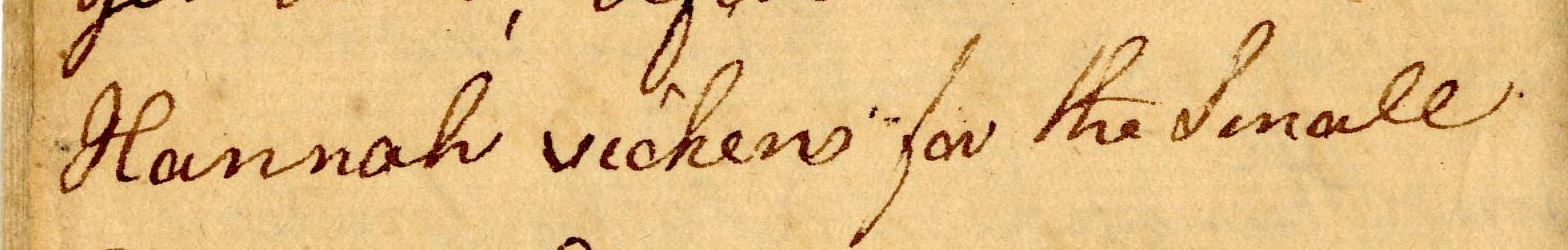Hannah sickens for the Small
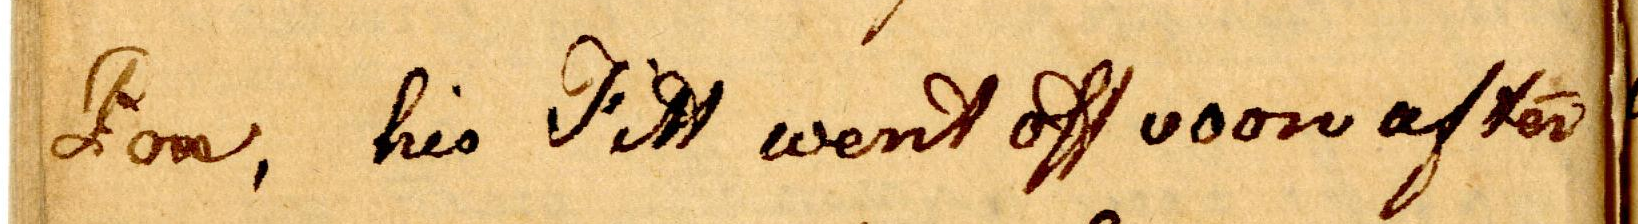Pox, his Fitt went off soon after
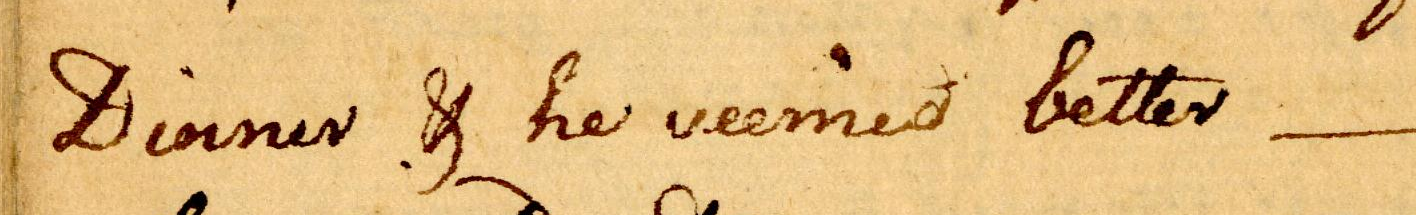Dinner & he seemed better-
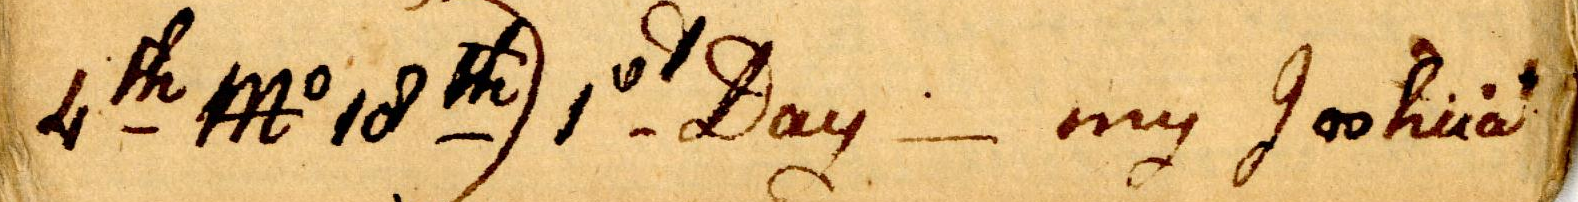4^th M^o 18^th) 1^st Day- my Joshua
